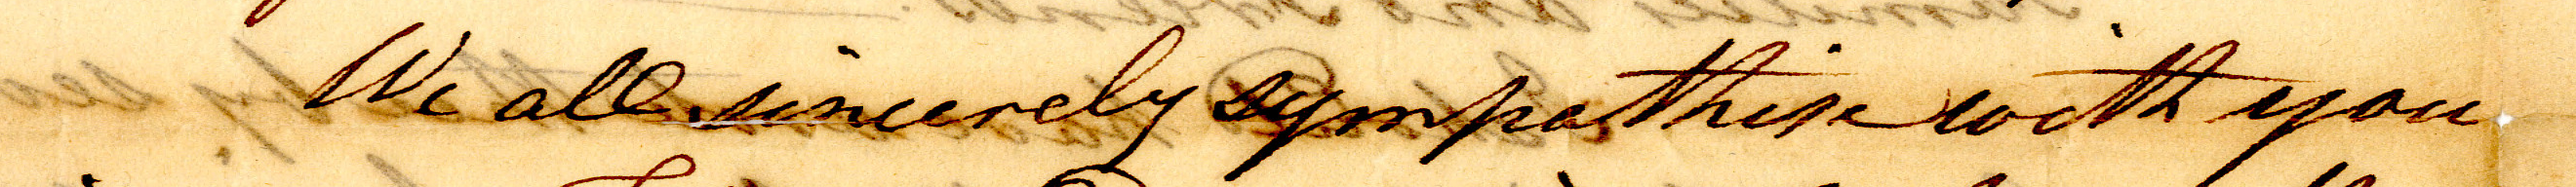We all sincerely sympathise with you
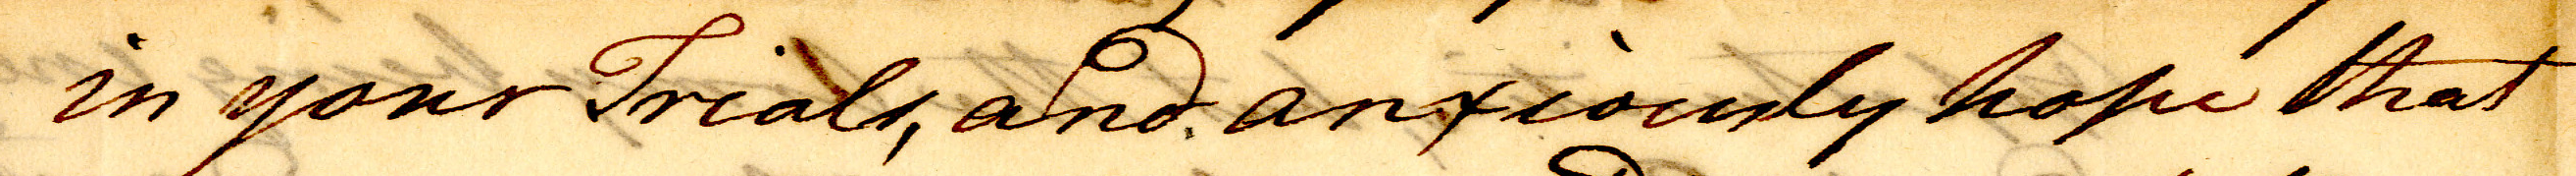in your Trials, and anxiously hope that
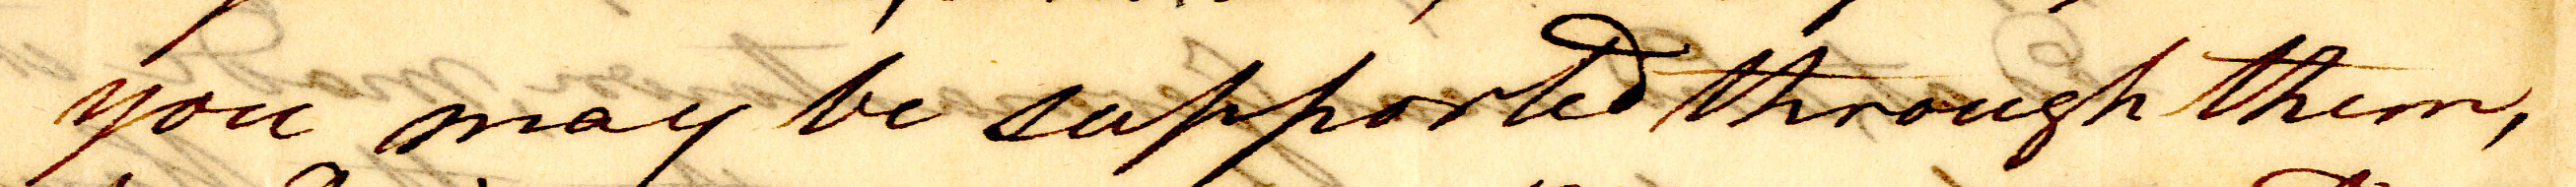you may be supported through them,
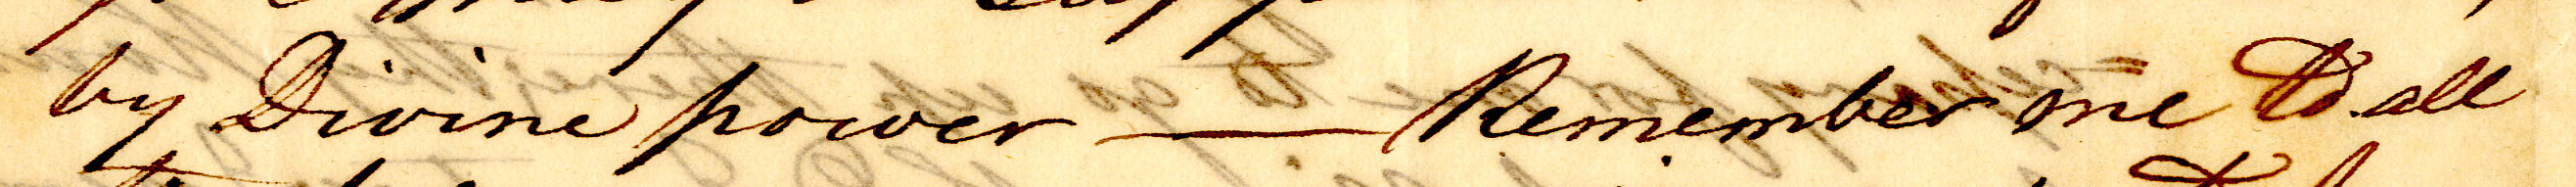by Divine power- Remember me to all
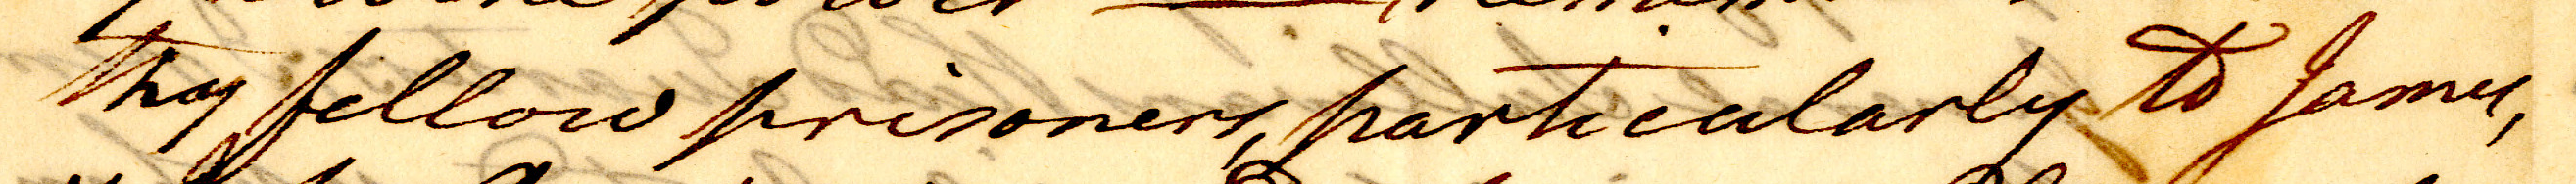thy fellow prisoners, particularly to James,
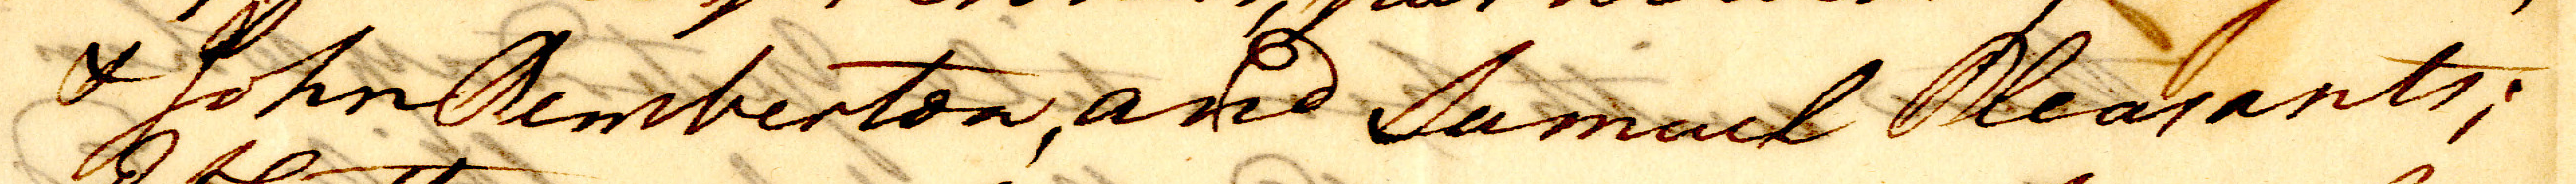& John Pemberton, and Samuel Pleasants;
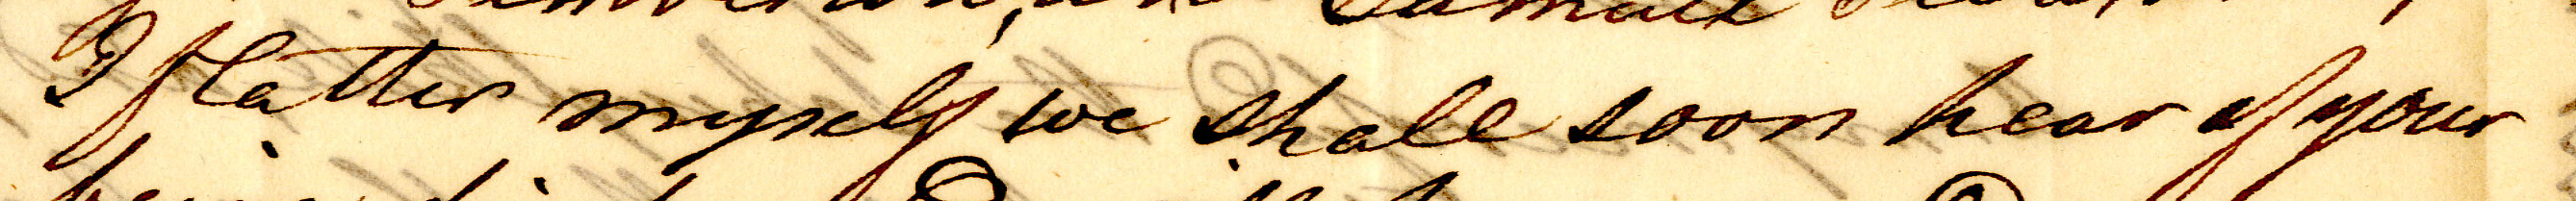I flatter myself we shall soon hear of your
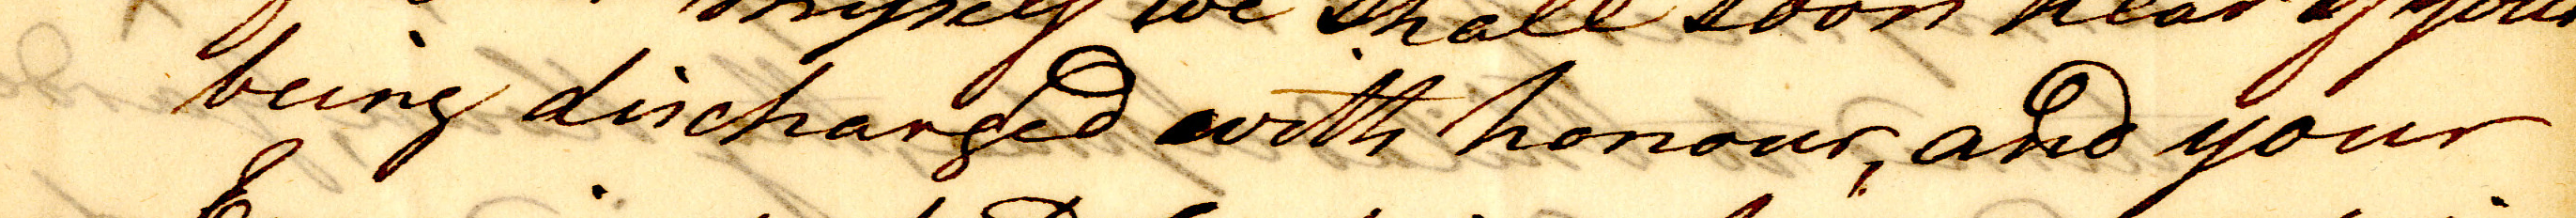being discharged with honour, and your
